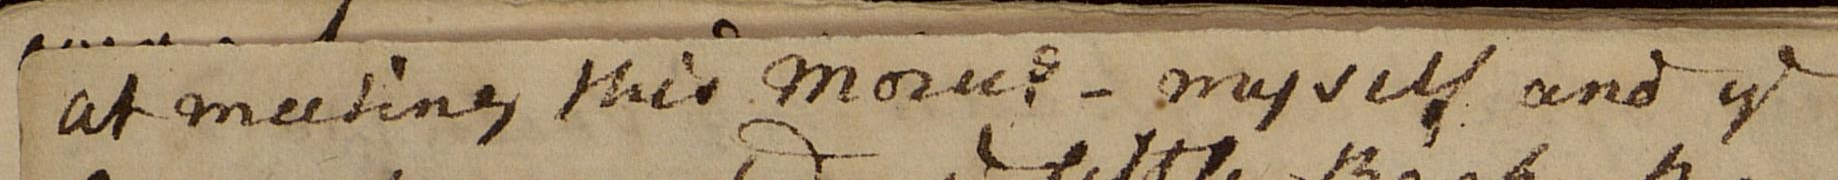at meeting this morn^g.- myself and y^e
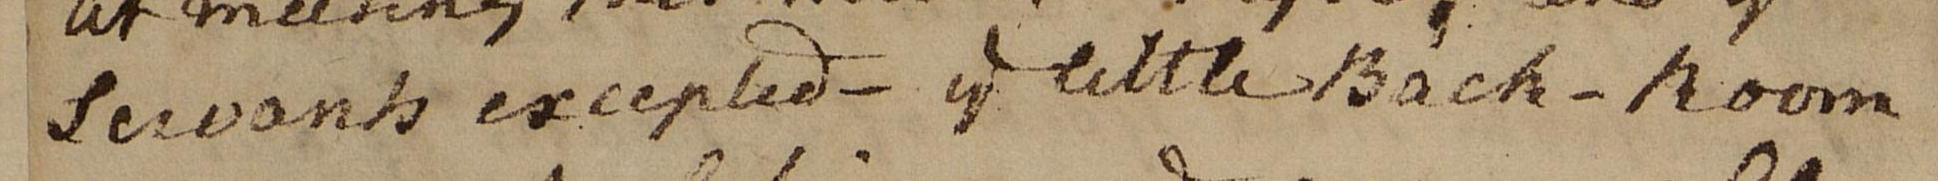servants excepted- y^e little Back- Room
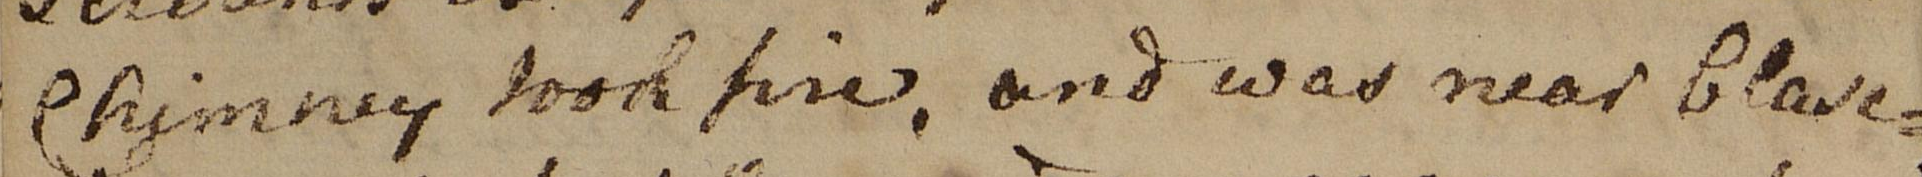Chimney took fire, and was near blase-
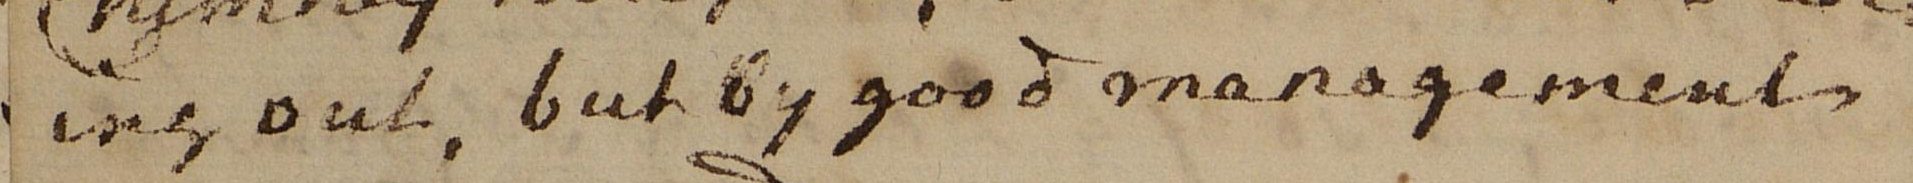ing out but by good management
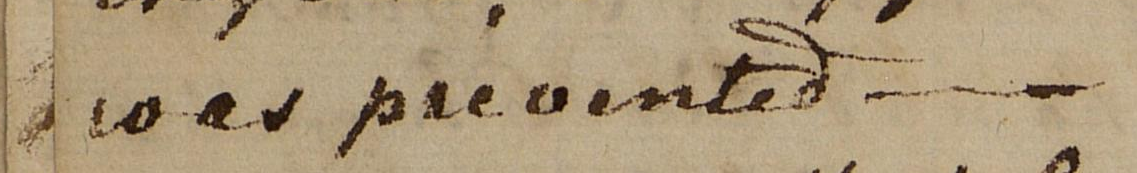was prevented-
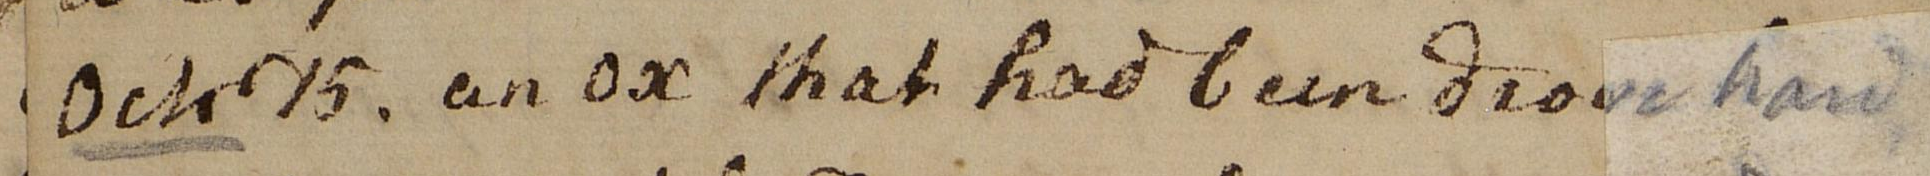Oct^r 15, an ox that had been drove hard
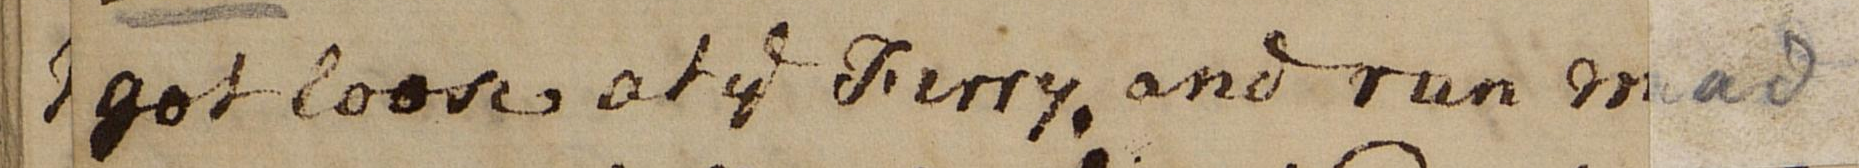got loose at y^e Ferry, and run mad
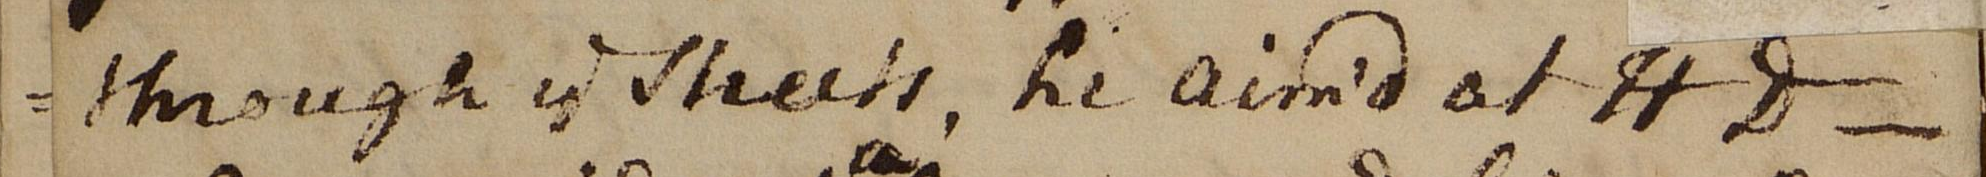through y^e Streets, he aim'd at HD-
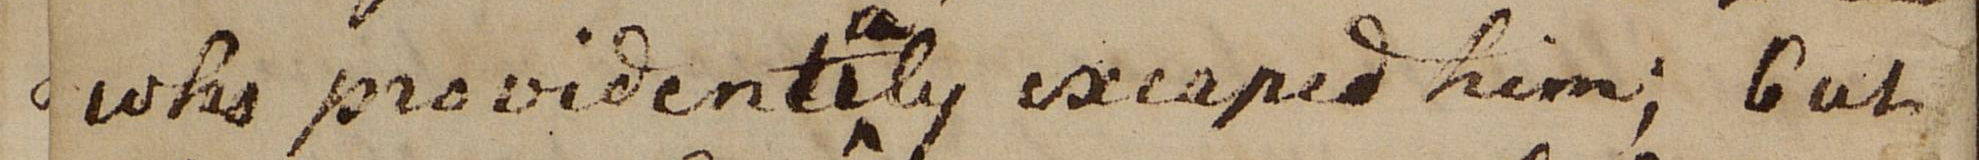who provident^a lly excaped him; but
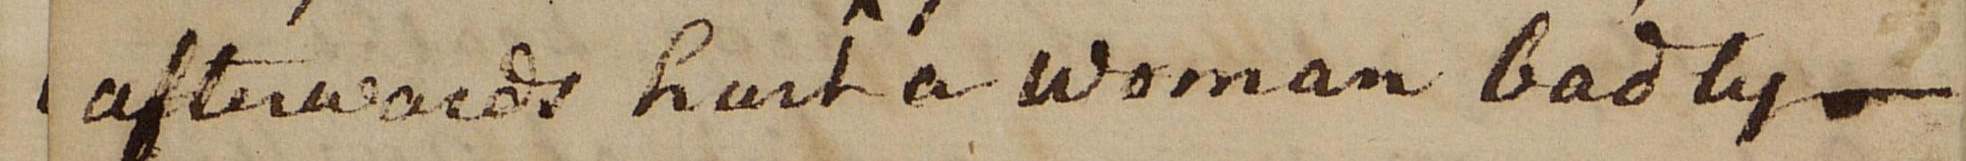afterwards hurt a woman badly-
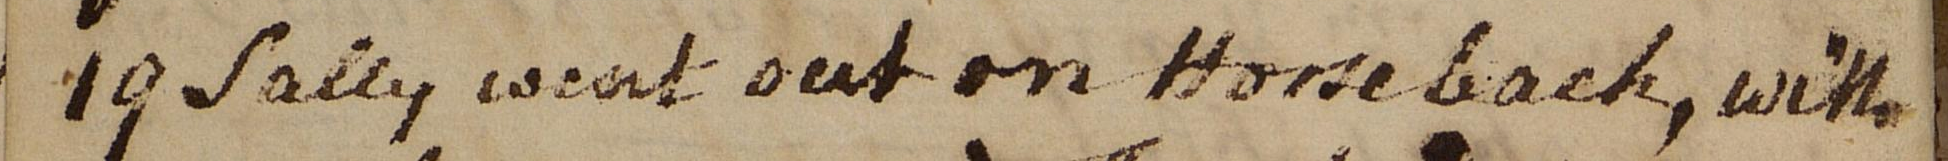19 Sally went out on Horseback, with
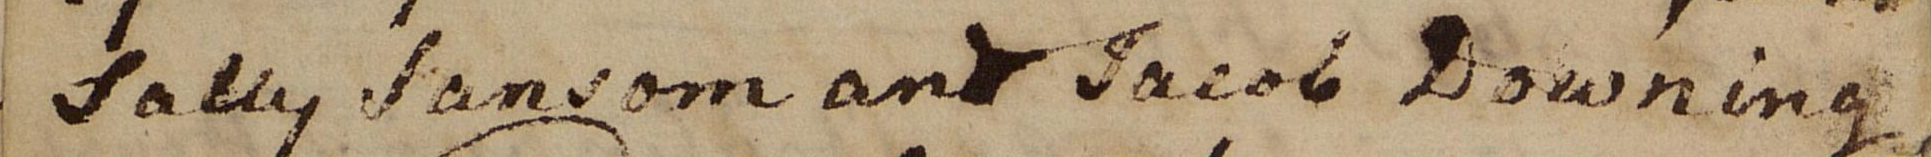Sally Sansom and Jacob Downing
